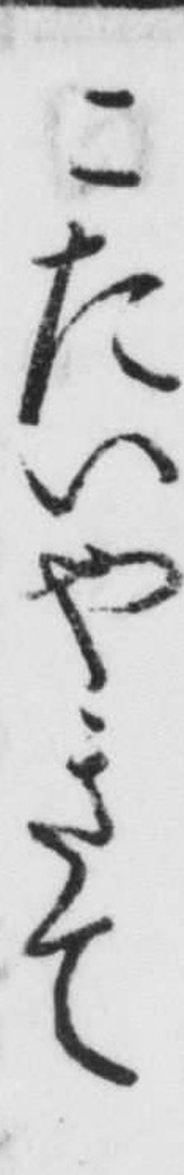こたいやきて
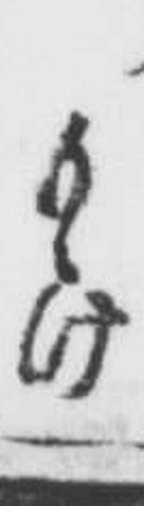もゝげ
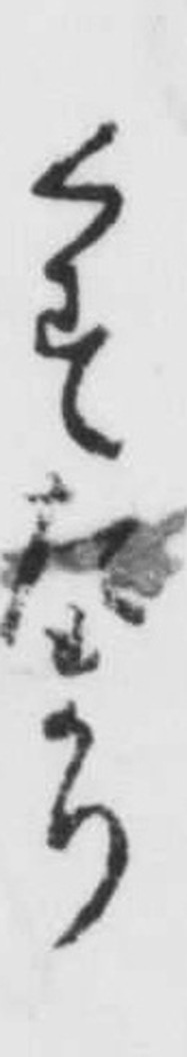くすたまり
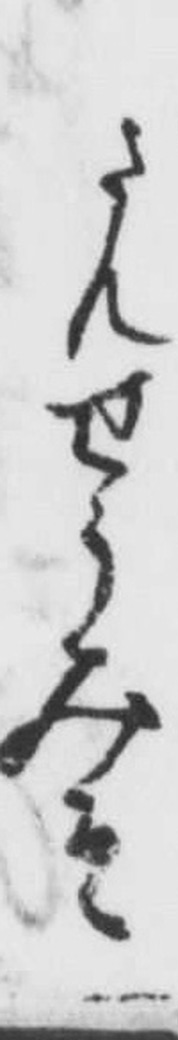さんせうみそ
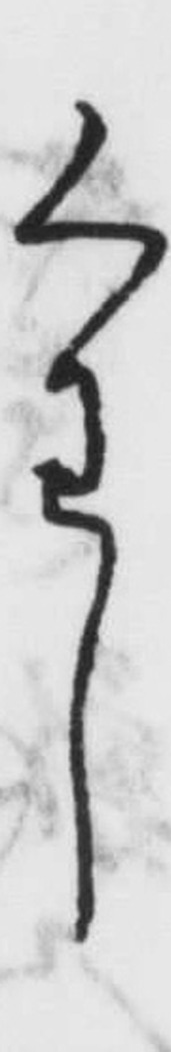くわし
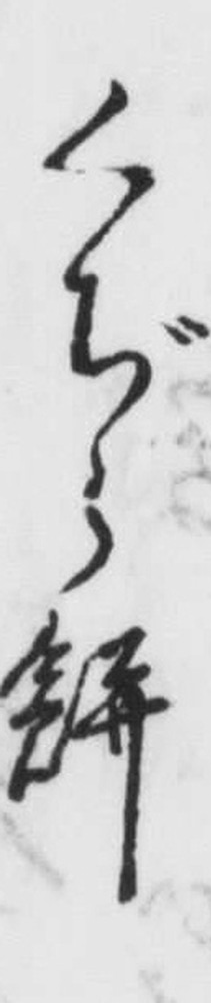くぢら餅
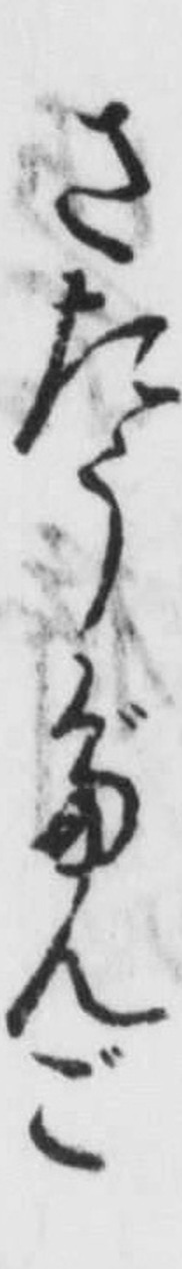さとうだんご

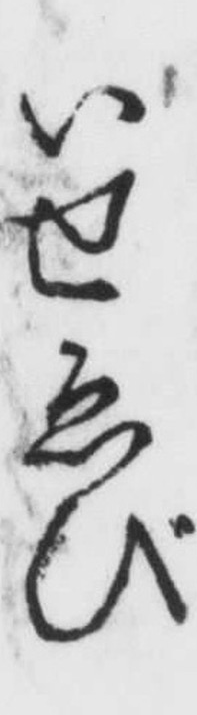いせゑび
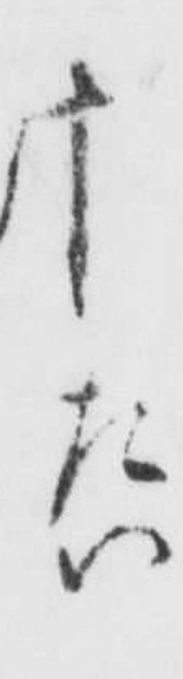汁たい
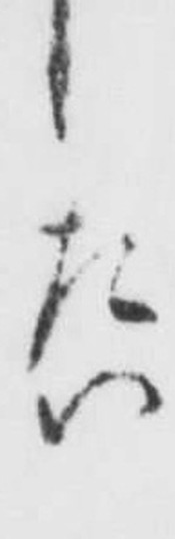汁たい

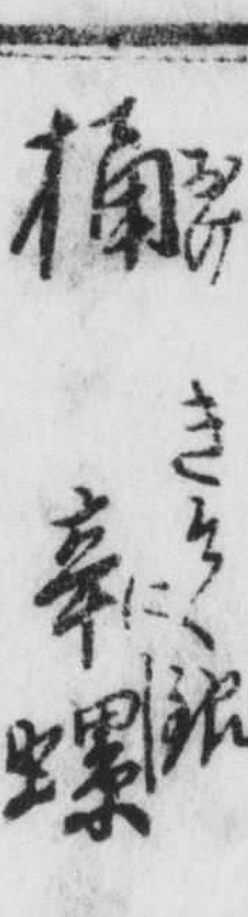桶辛螺
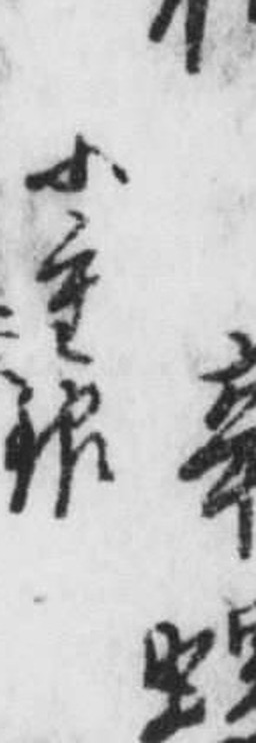小重鉢
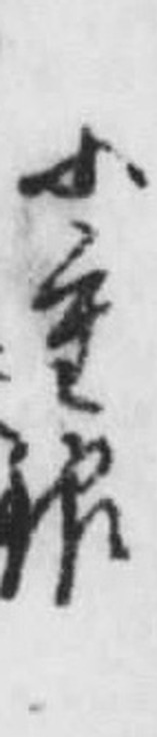小重鉢
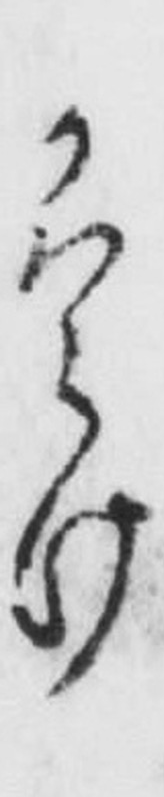かハらけ
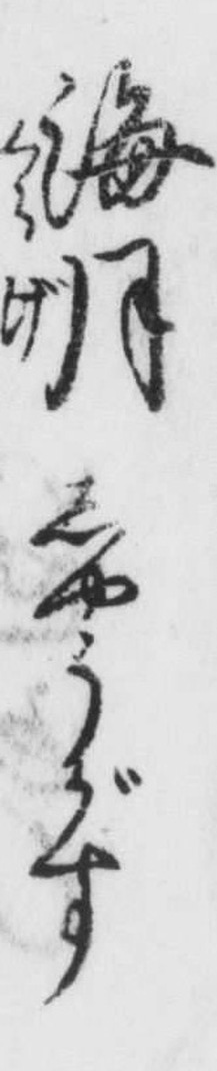海月しやうかす
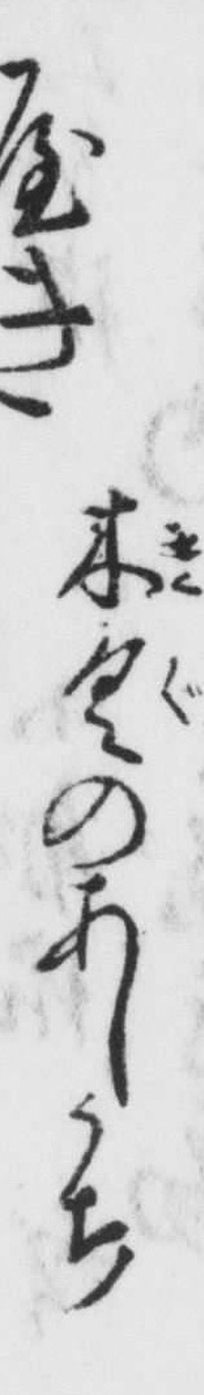へき木のあしうち
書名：料理切形秘伝抄
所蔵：大阪府立大学学術情報センター 国文学研究資料館
